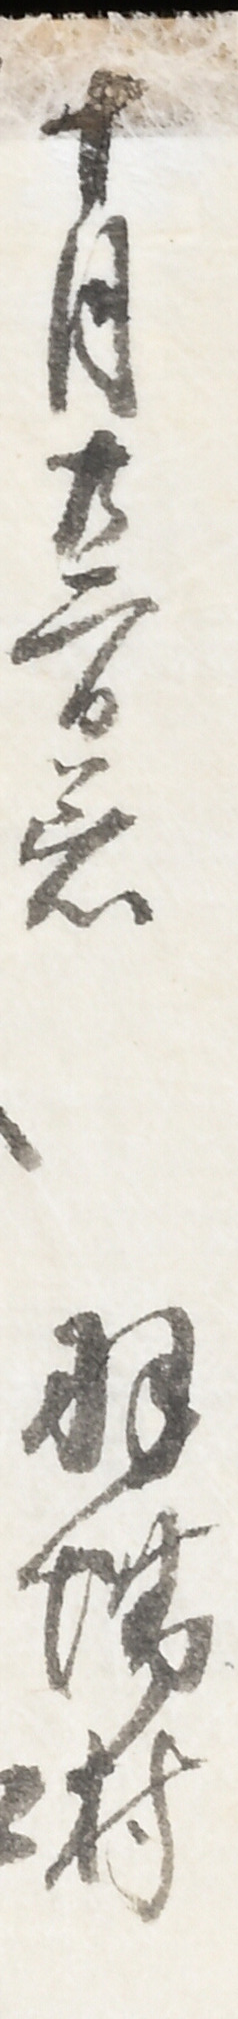十月廿二日着羽場村
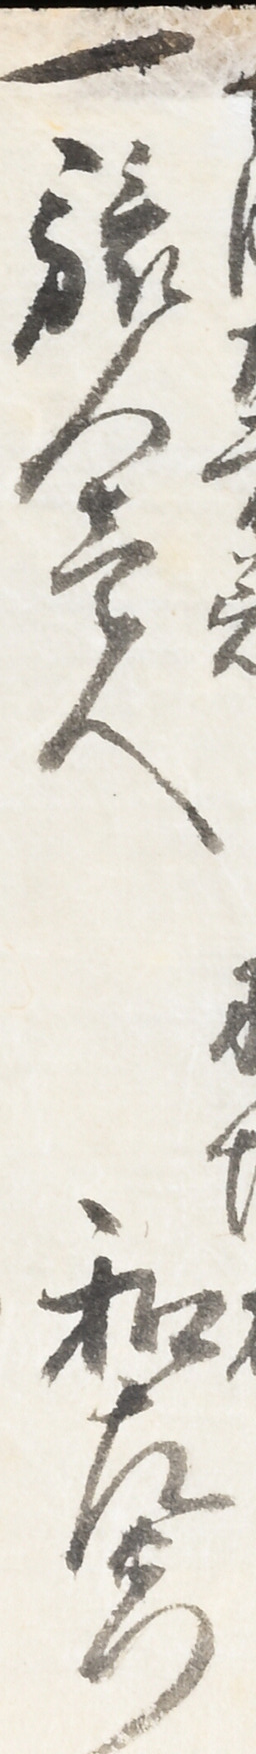一旅人壱人和左衛門・
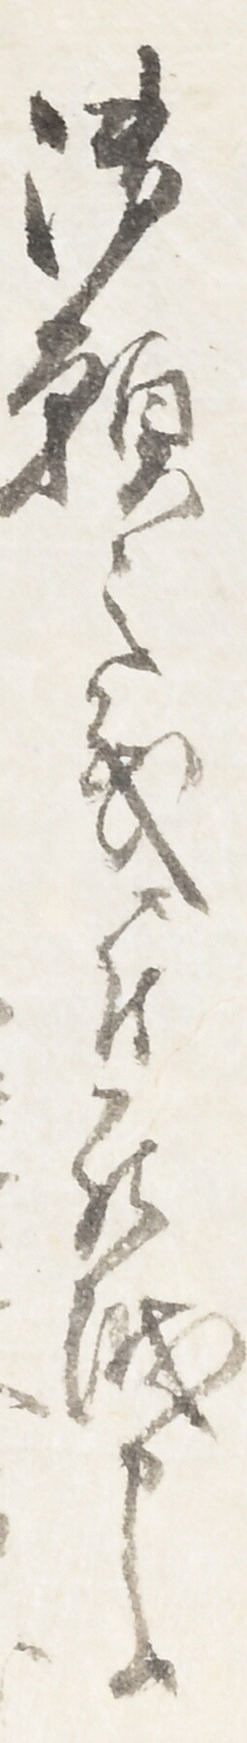御願之義ニ付罷越申候
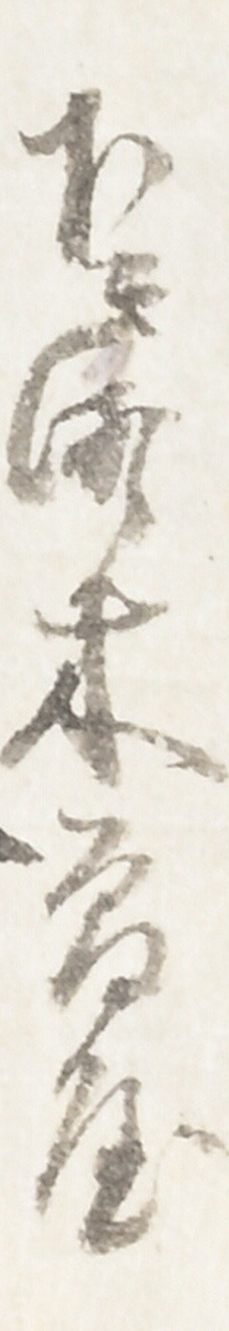下モ町木曽屋
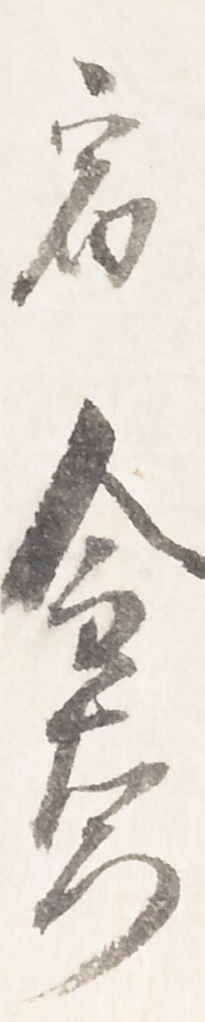宿金右衛門
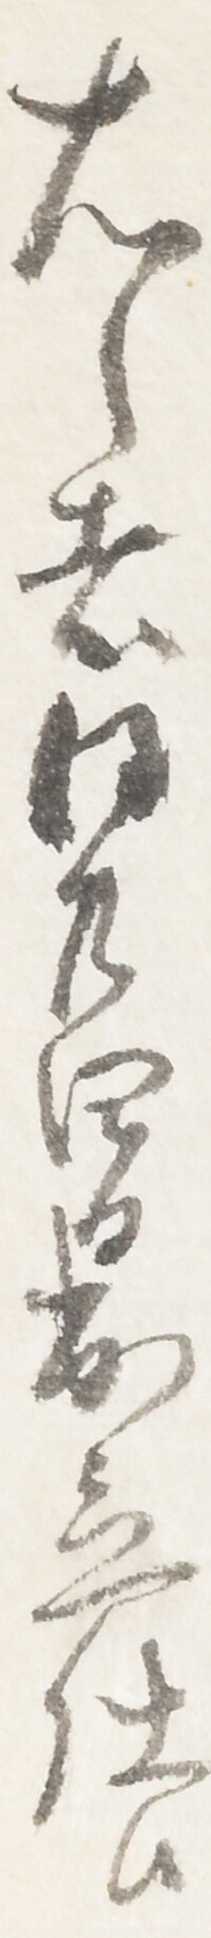右之者同廿四日出立仕候
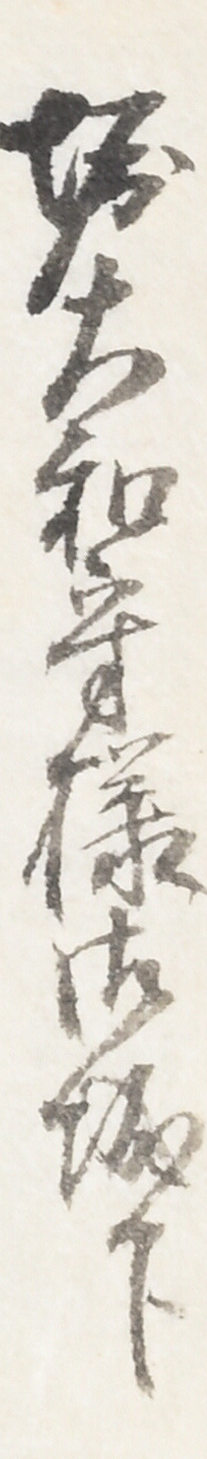堀大和守様御城下
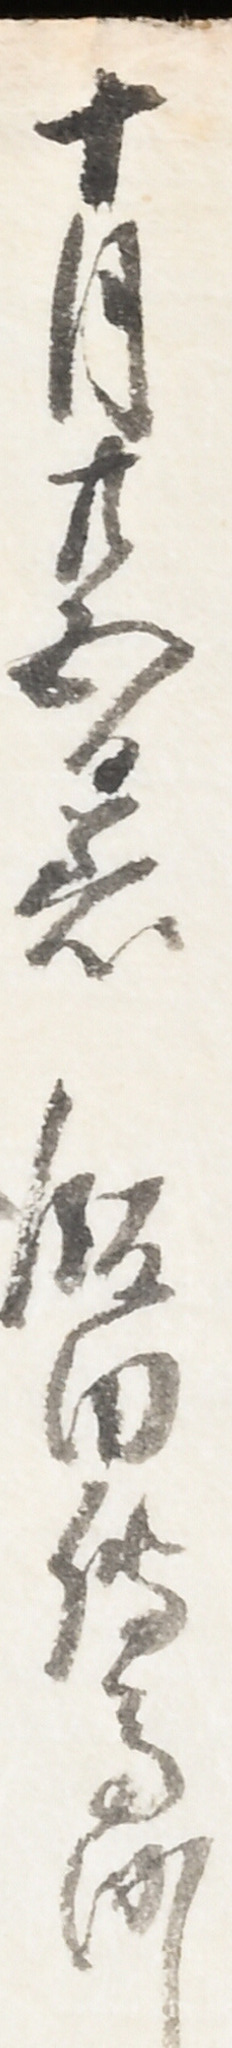十月廿五日着飯田伝馬町
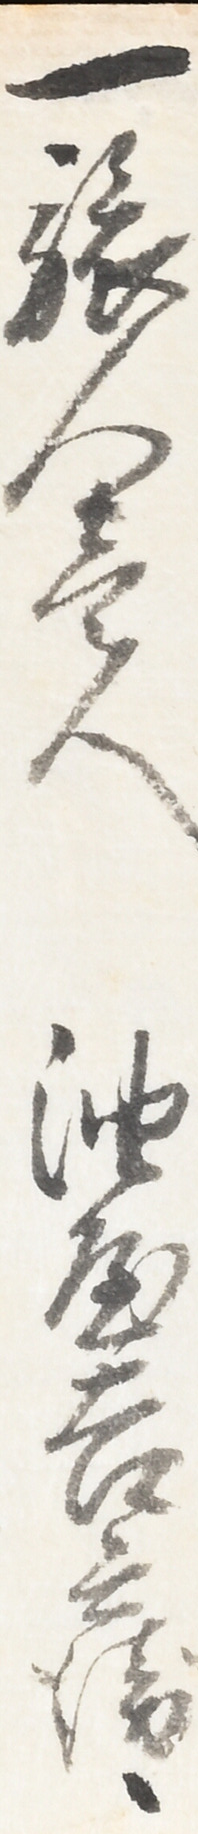一旅人壱人油屋吉兵衛・
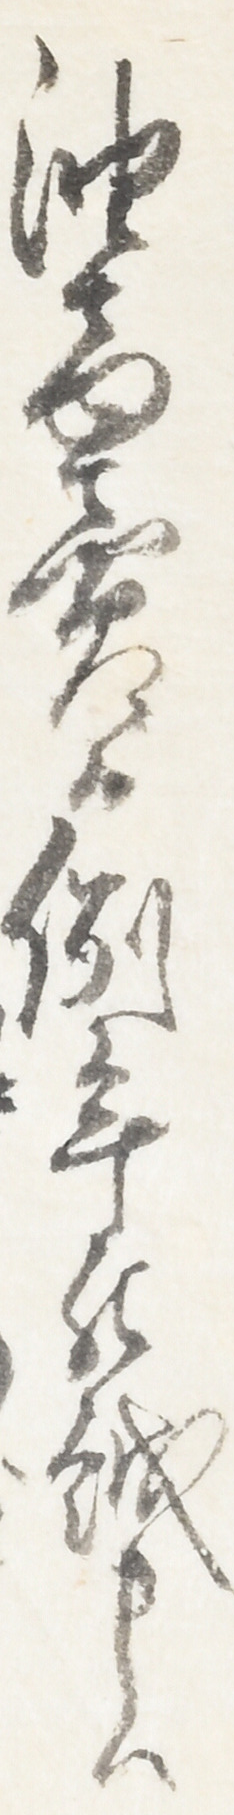油商売ニ而例年罷越申候
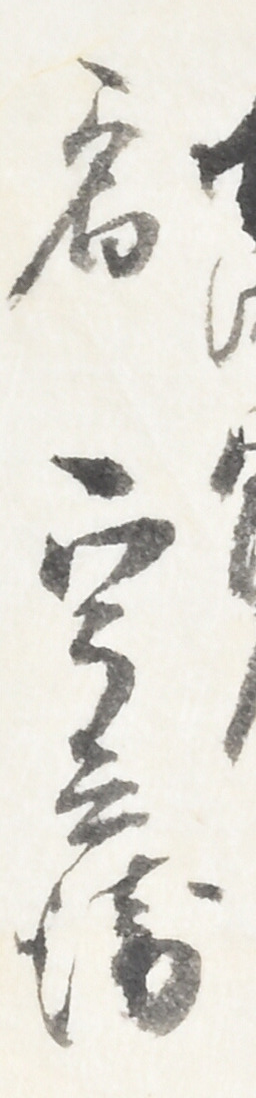宿宇兵衛
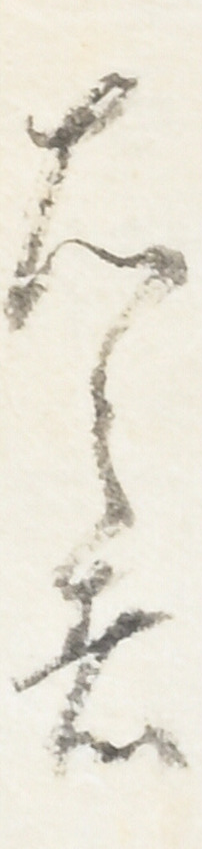右之者
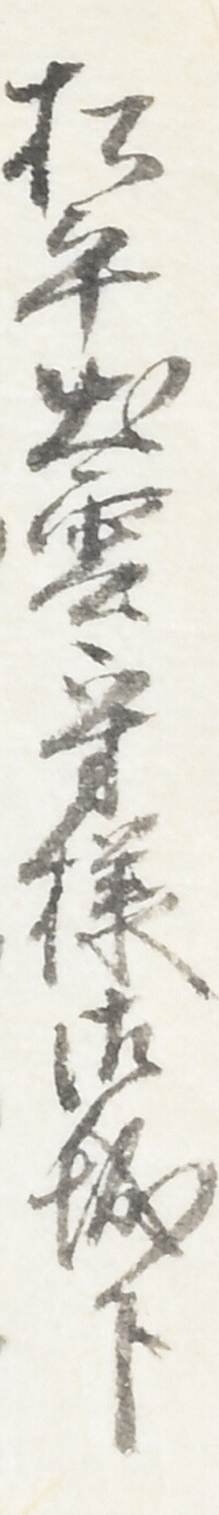松平出雲守様御城下
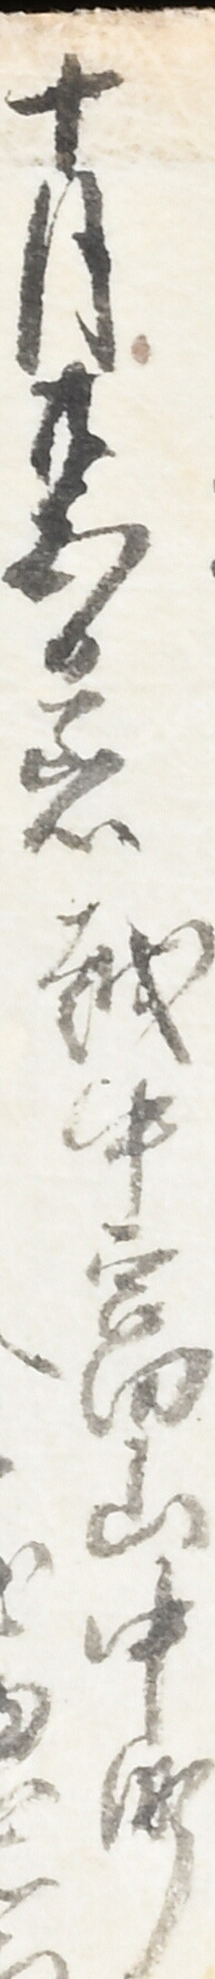十月廿五日着越中富山中町
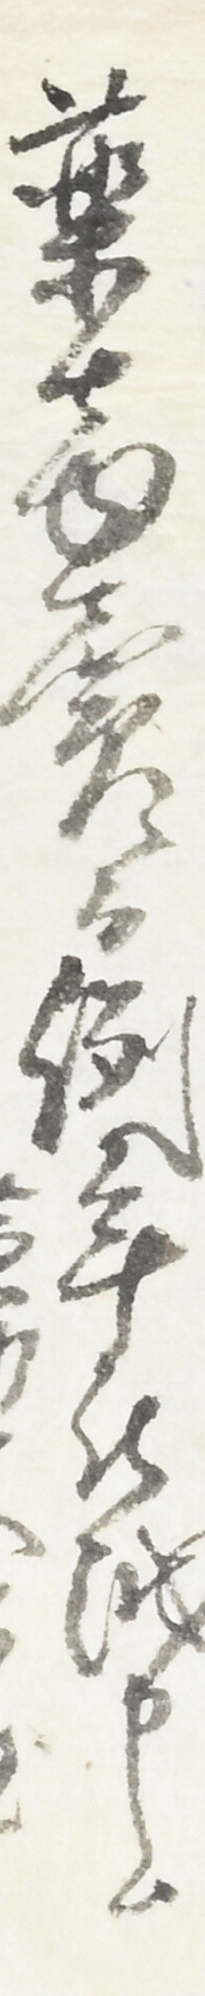薬商売ニ而例年罷越申候
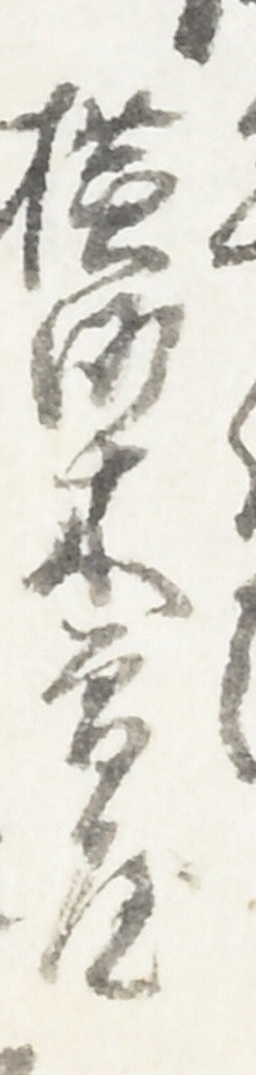横町木曽屋
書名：旅人泊控帳
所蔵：伊那市立高遠町図書館・合同会社AMANE
